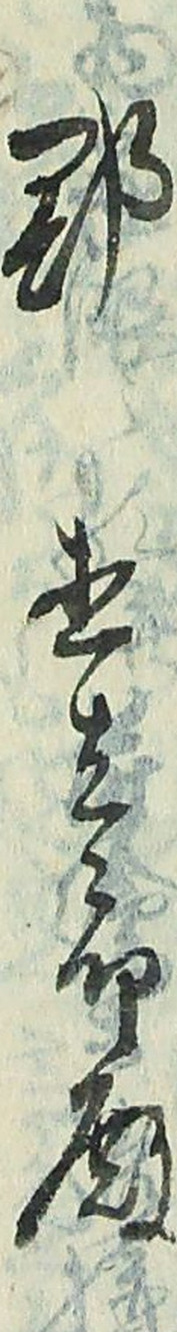郡直太郎殿
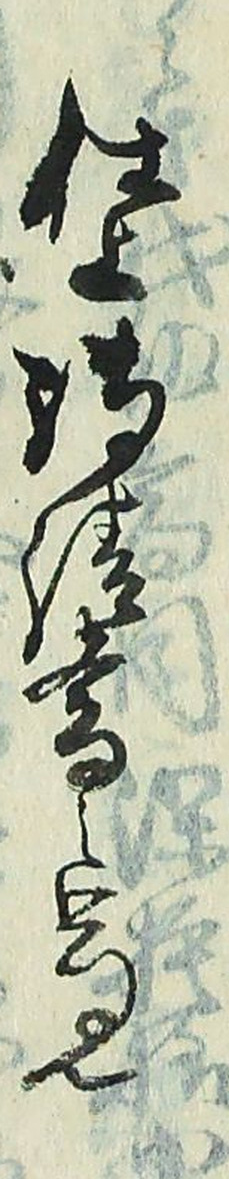仕上御請書之覚
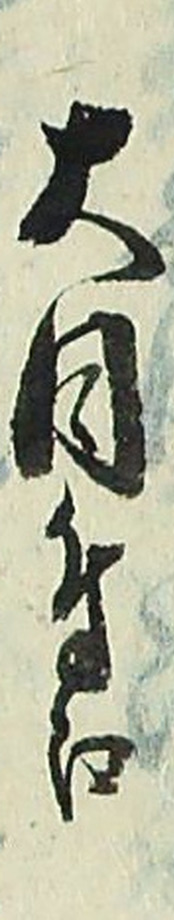大目付江
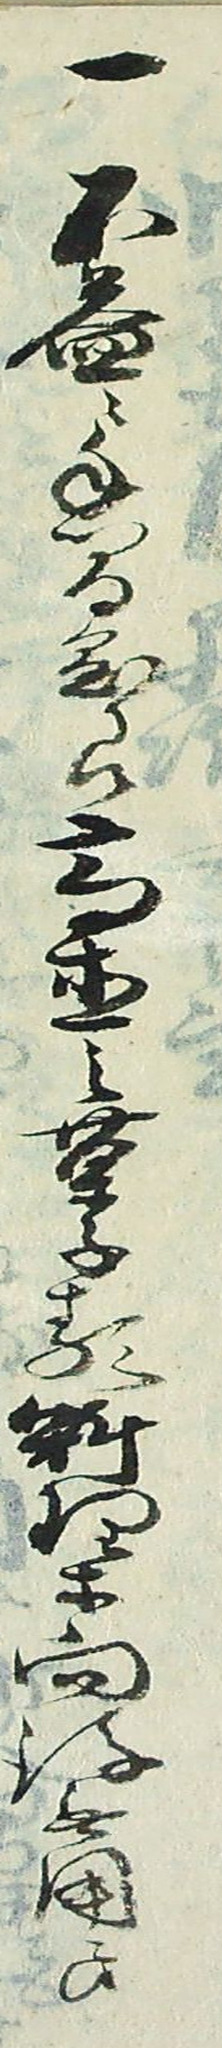一不益に手間懸候高直之菓子類料理等向後無用に候
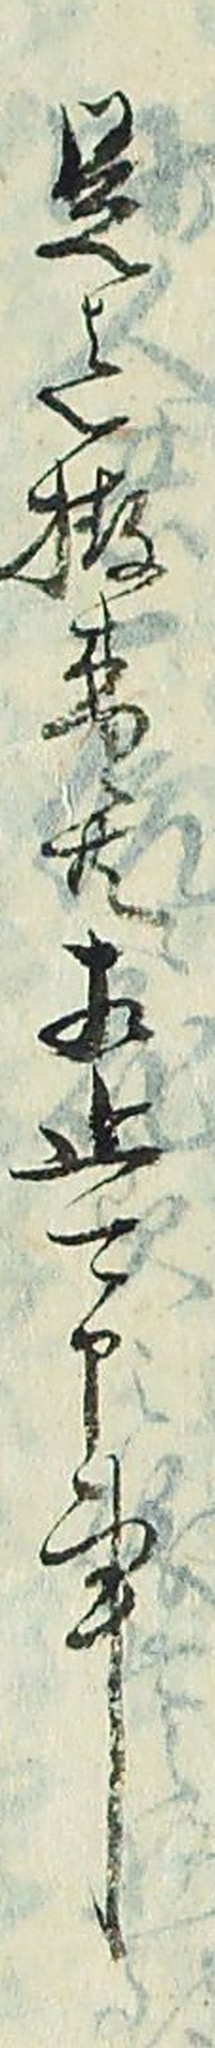是迄拵来候共相止可申事
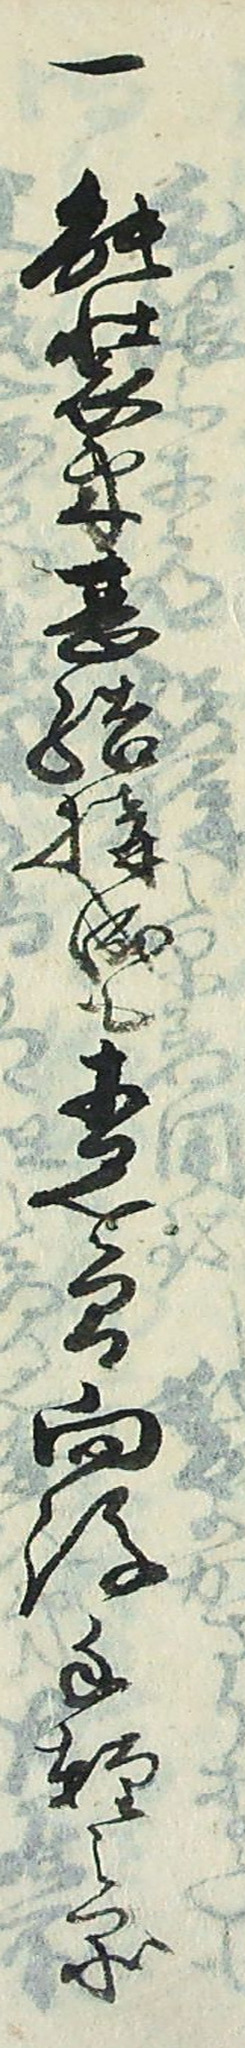一能装束甚結構成も相見候間向後手軽之品
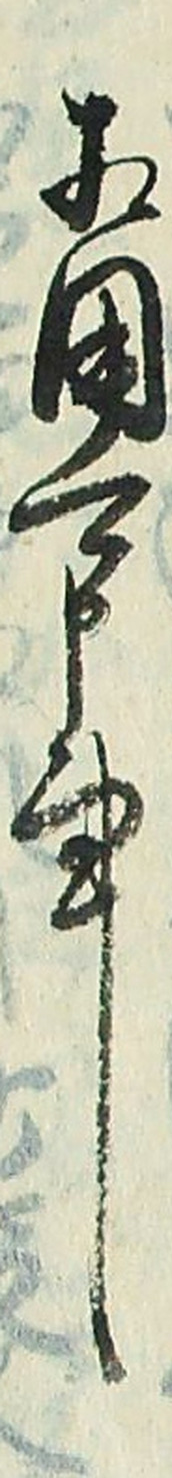相用可申事
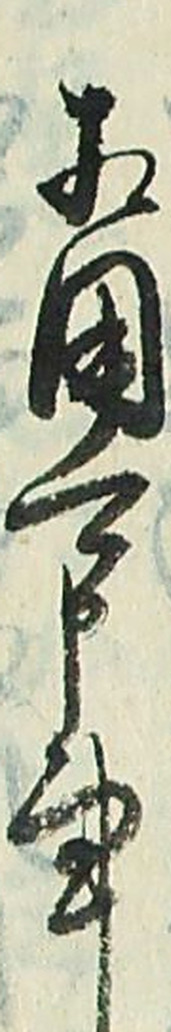相用可申事

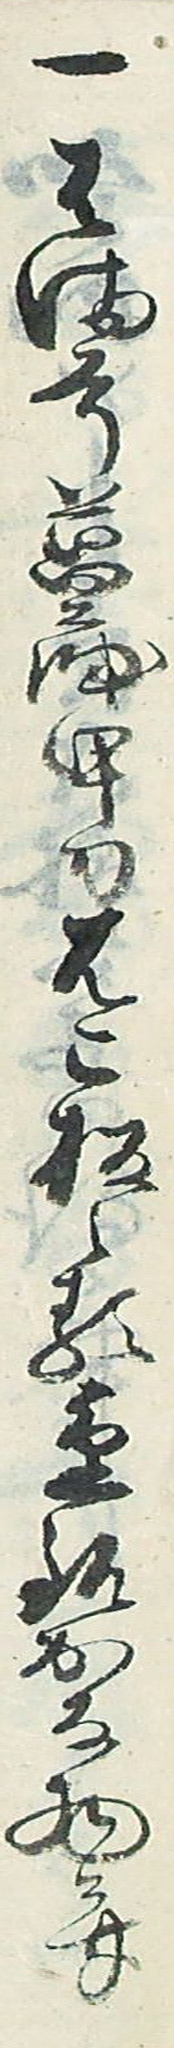一はま弓菖蒲甲刀はこ板之類金銀かな物幷
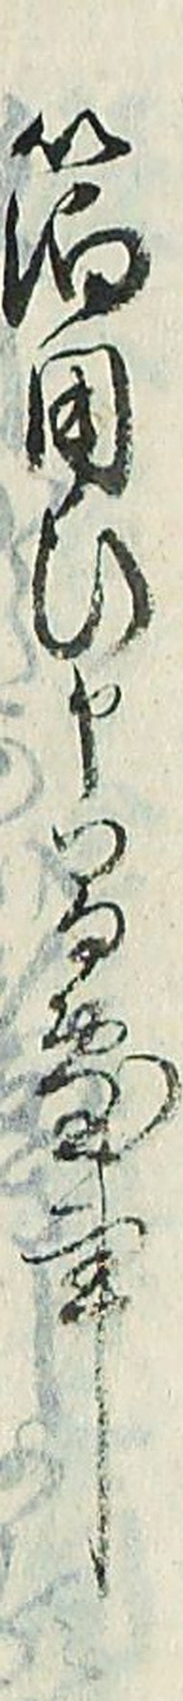箔用ひ申間敷事
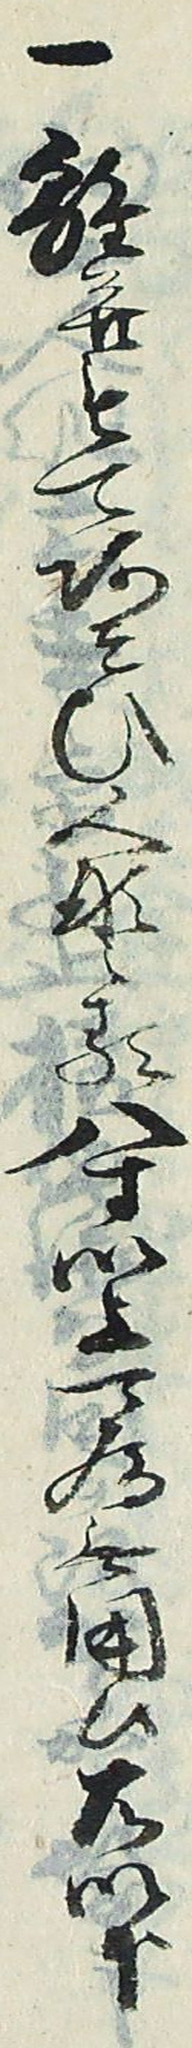一雛幷もてあそひ人形之類八寸以上可為無用候右以下
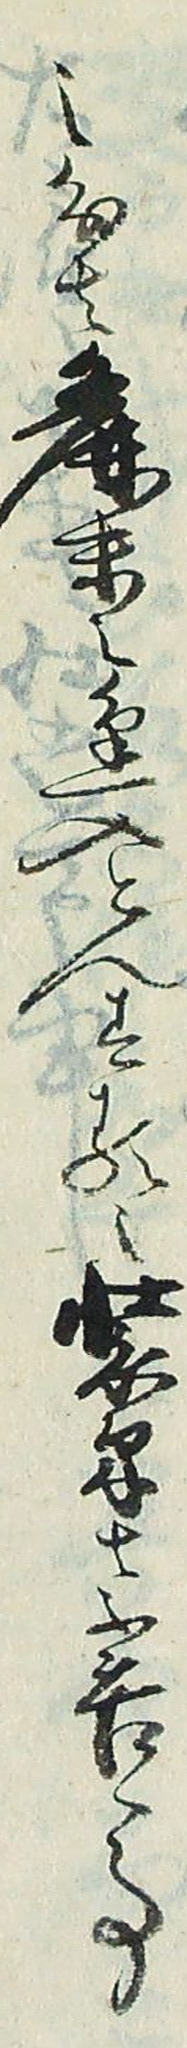之分は麁末之金入とんす類之装束は不苦候事
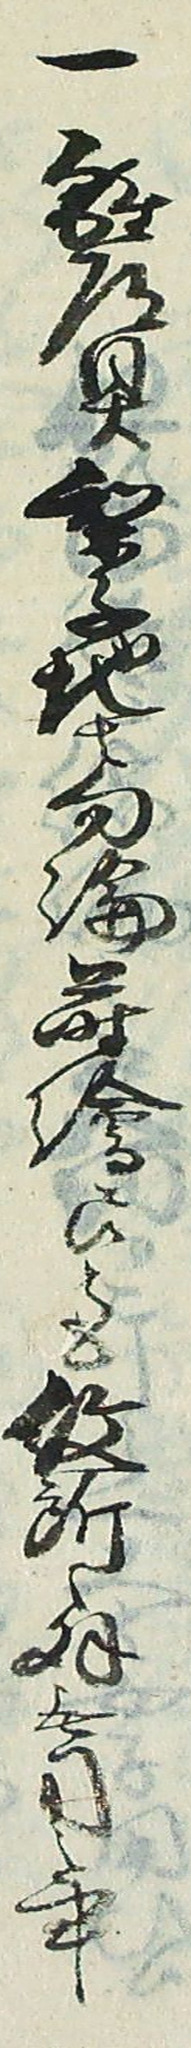一雛道具梨子地は勿論蒔絵に候とも紋所之外無用之事
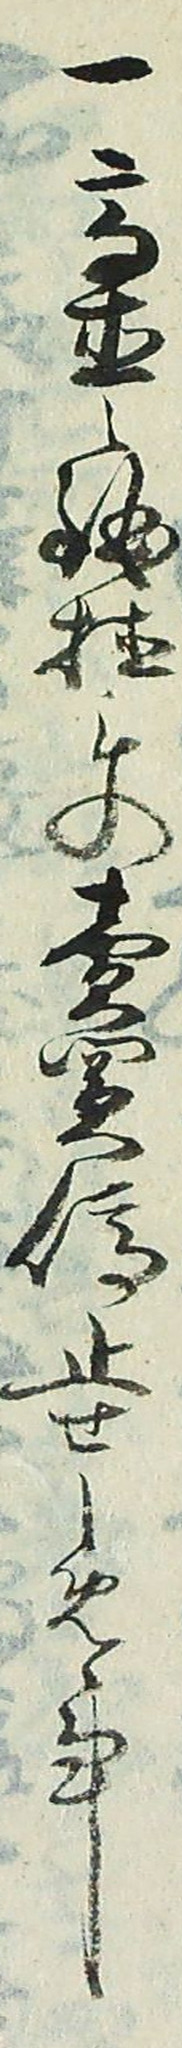一高直之鉢植もの売買停止せしめ候事
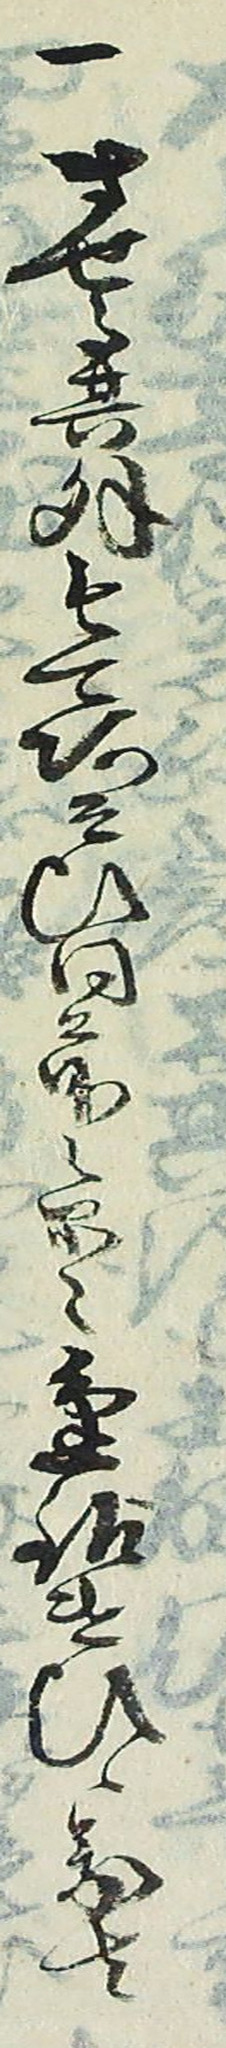一きせる其外もてあそひ同前之品々金銀遣ひ候義は
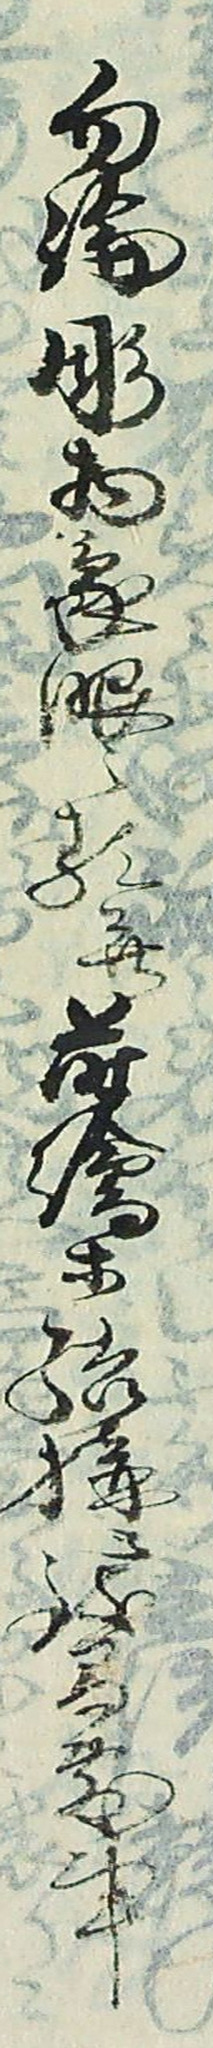勿論彫物象眼之類幷蒔絵等結構に致間敷事
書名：諸御用御□受書控
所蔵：鳴門教育大学 Naruto University of Education
